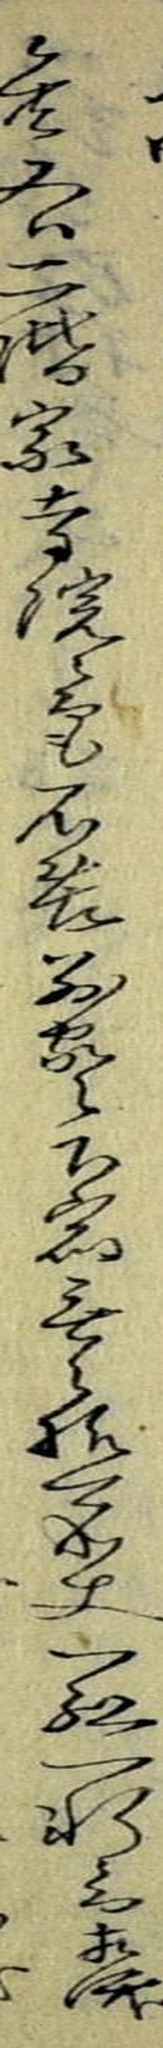候共又ハ二階家寺院ニ而も不苦別家之下宿無之様可成丈一組一軒ニ而相済
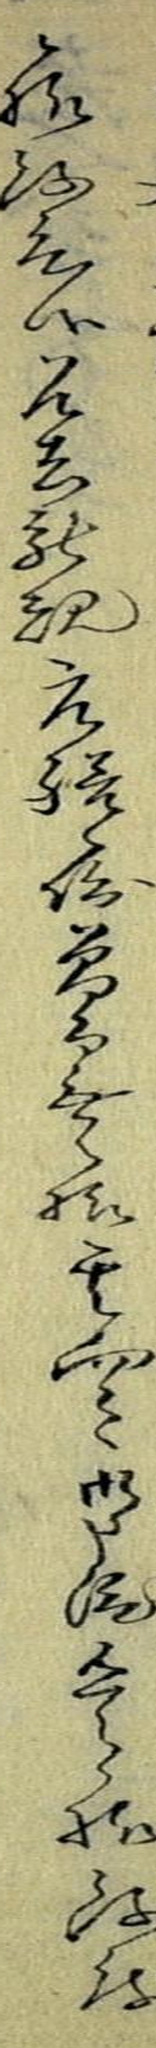候様致度候乍去新規取繕之儀曽而無之様其向々へ御申渡有之候様致度
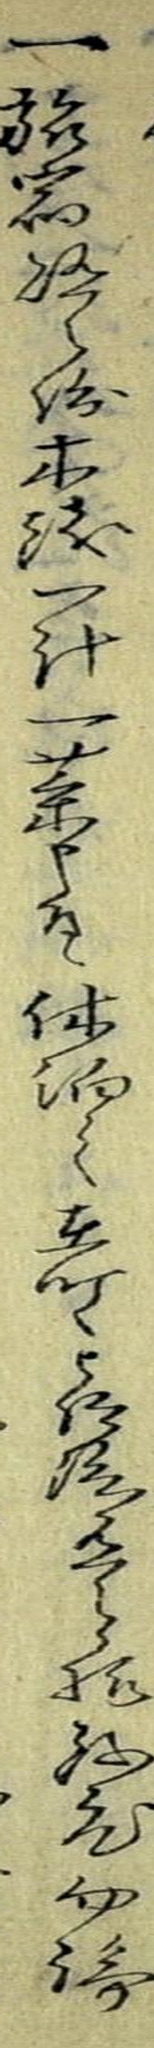一旅宿賄之儀木銭一汁一菜申付候休泊之在町へ被仰渡有之候様致度勿論
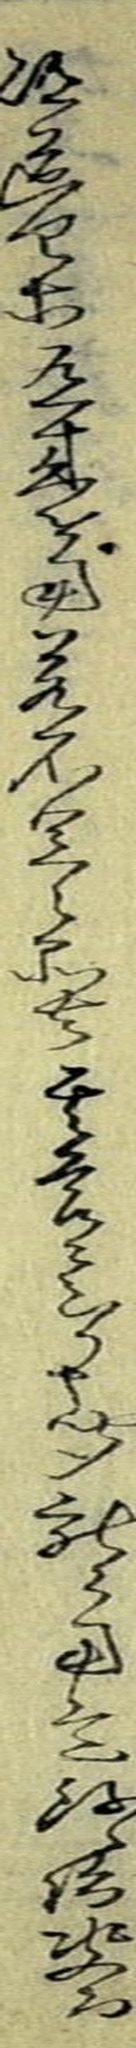賄道具等有来を用若不宜之品者其節ニ至り申聞新ニ用意致候儀決而
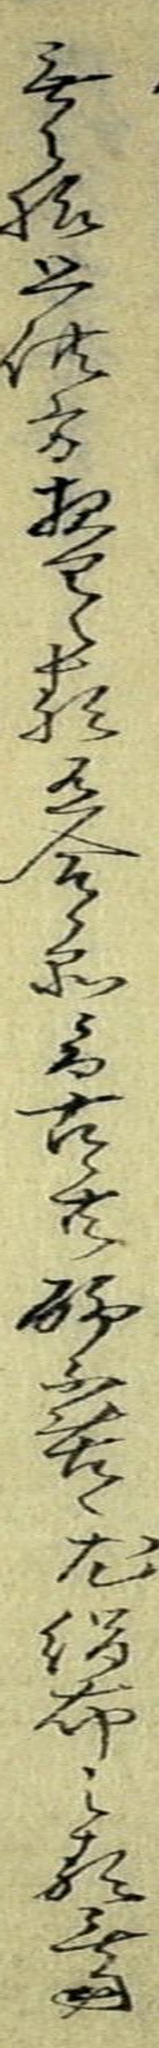無之様且供方夜具之類有合之品ニ而古く共聊不苦候尤絹布之類無用
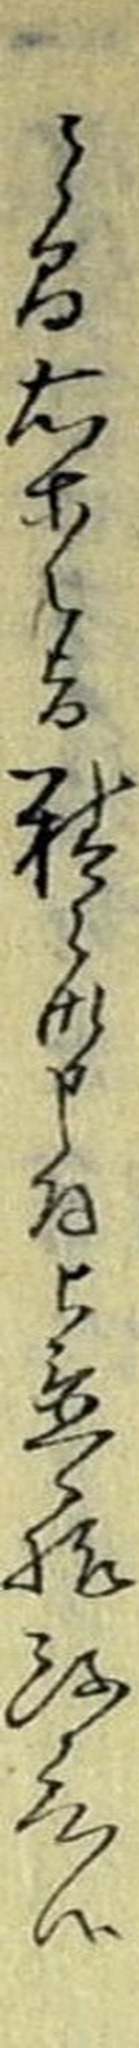ニ候間右等之旨精々御申付被置候様致度候
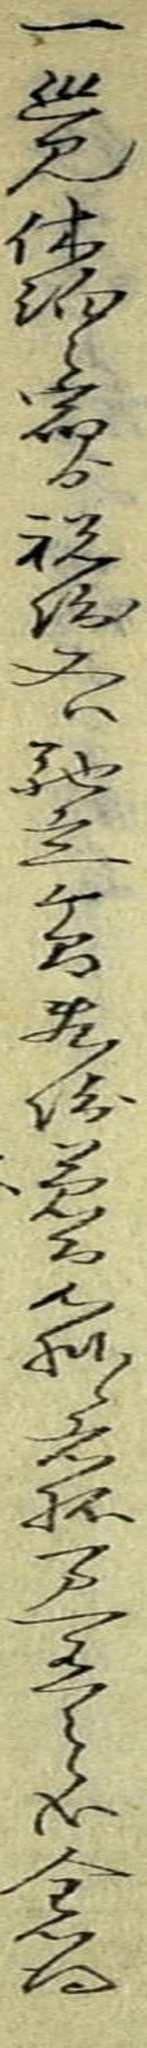一巡見休泊之宿ゟ祝儀又ハ馳走ケ間敷儀兼而心掛候者抔万一有之哉全心得
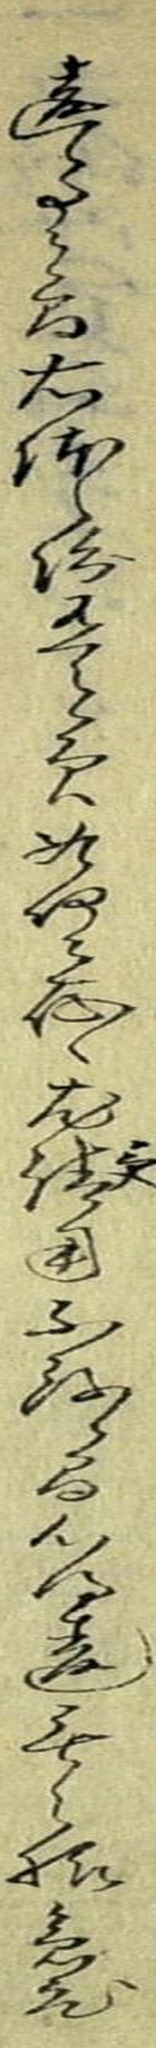違之事ニ候間右体之儀有之候而ハ如何と存候尤請用不致候間心得違無之様急度
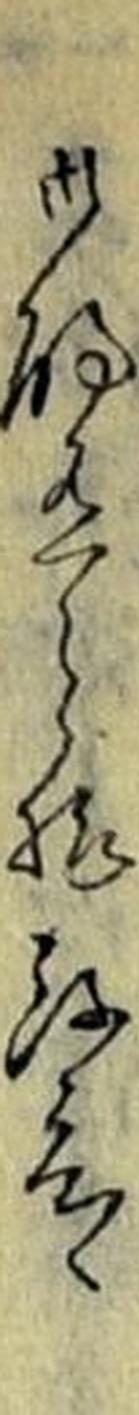御触有之候様致度候
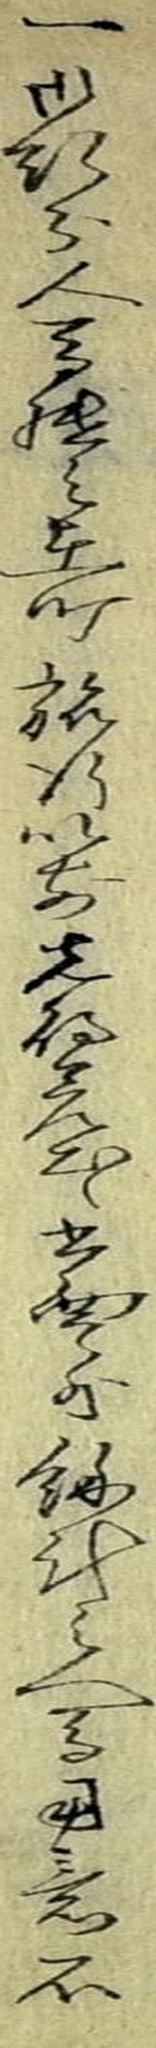一御領分人馬継之在町旅行以前先触差出候書面之外余計之人馬用意不
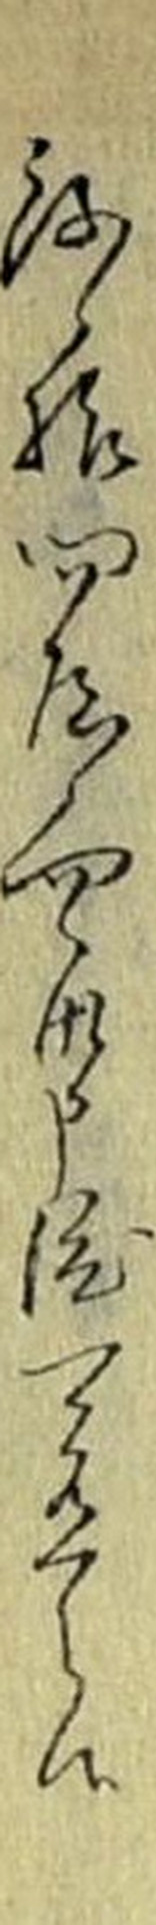致候様問屋向へ御申渡可有之候
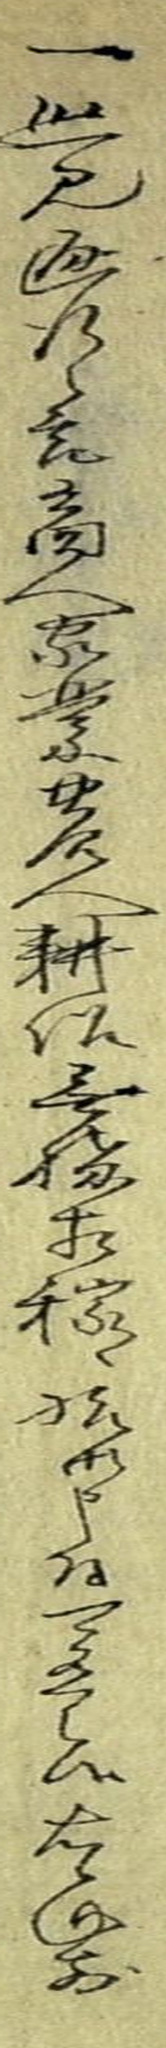一巡見通行之節商人家業農人耕作無構相稼候様御申付可有之候右之趣前
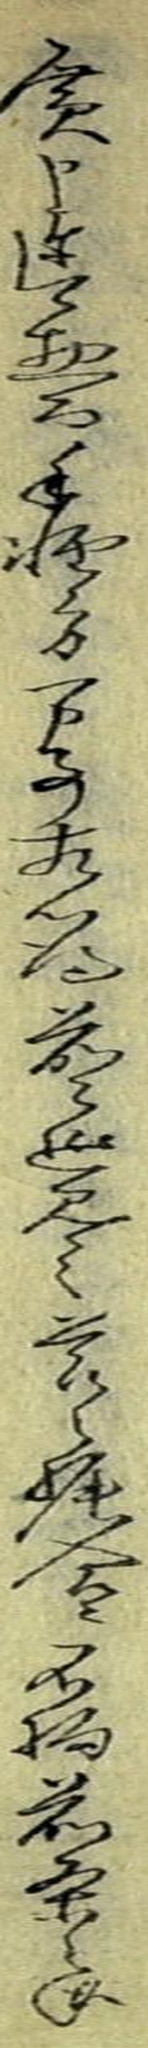広申達候惣而手軽方万事相心得前々巡見之節之振合ニ不拘前条之趣
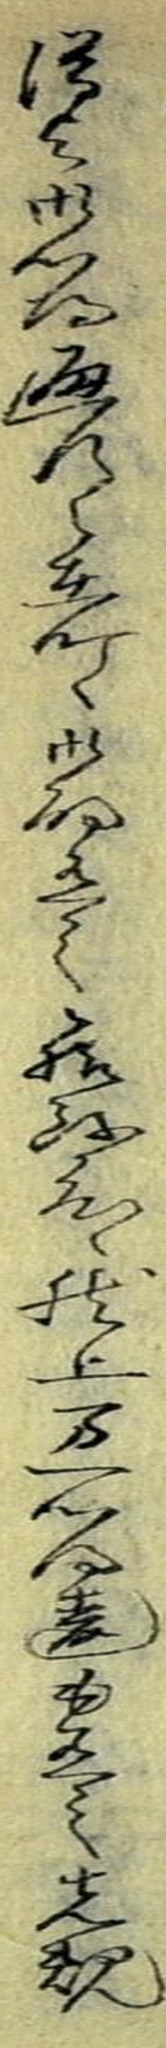得与御心得通行之在町へ御触有之候様致度候然上万一心得違も有之先規

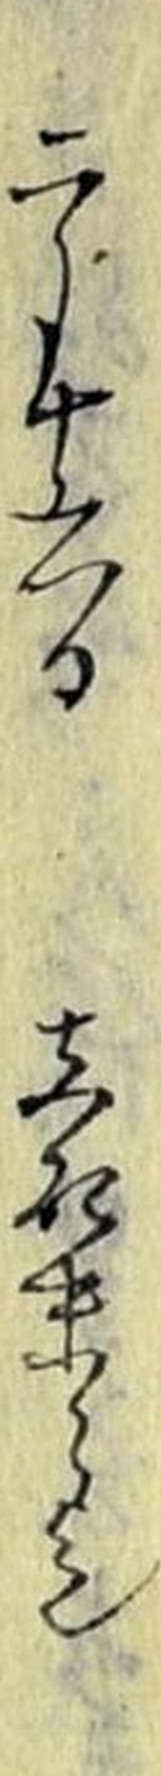二月十六日支配末々迄
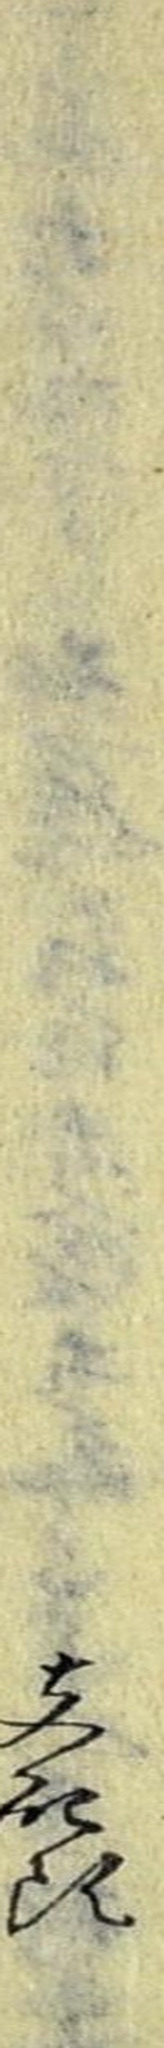支配頭
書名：命令之部 五
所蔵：福井県文書館 Fukui Prefectural Archives
